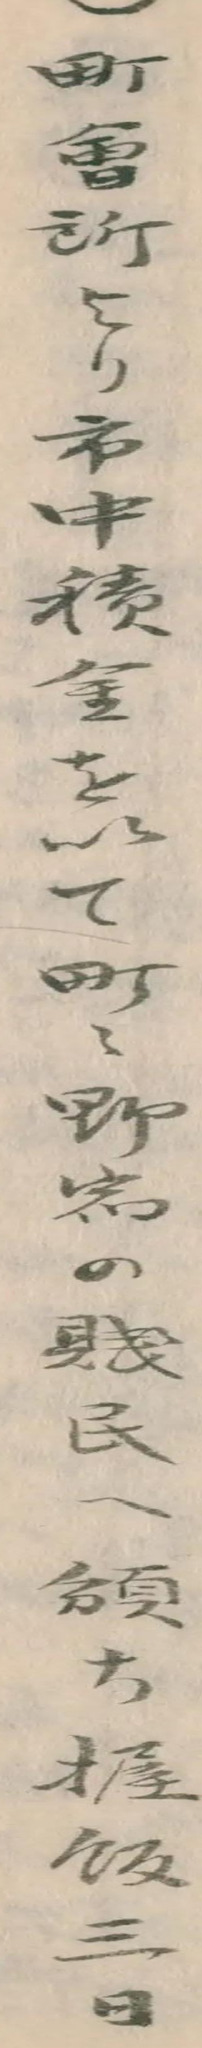〇町会所より市中積金を以町々野宿の賎民へ頒ち握飯三日
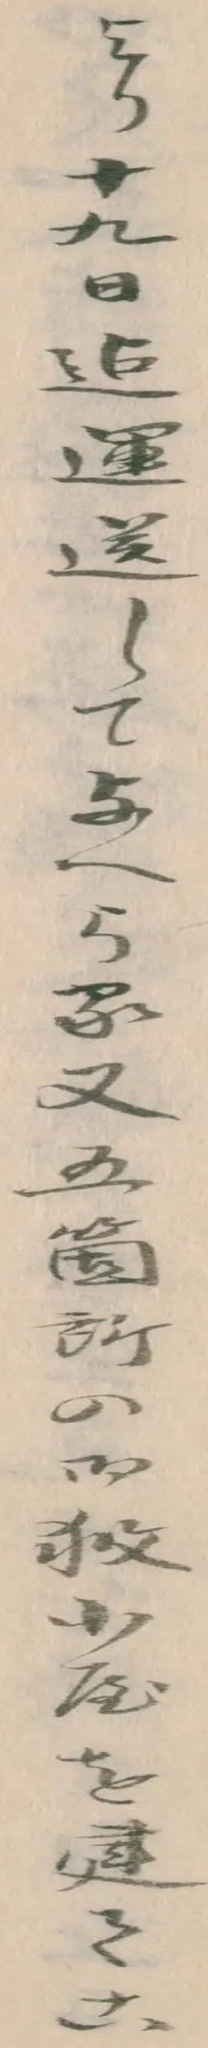より十九日迄運送して与へらる又五箇所の御救小屋を建てこ
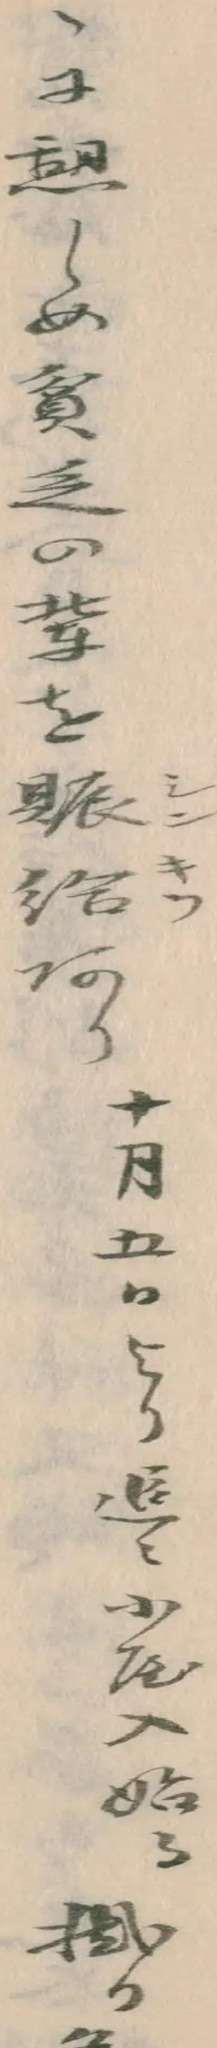ゝに憩しめ貧乏の輩を賑給あり十月五日より追々小屋入始る掛り名
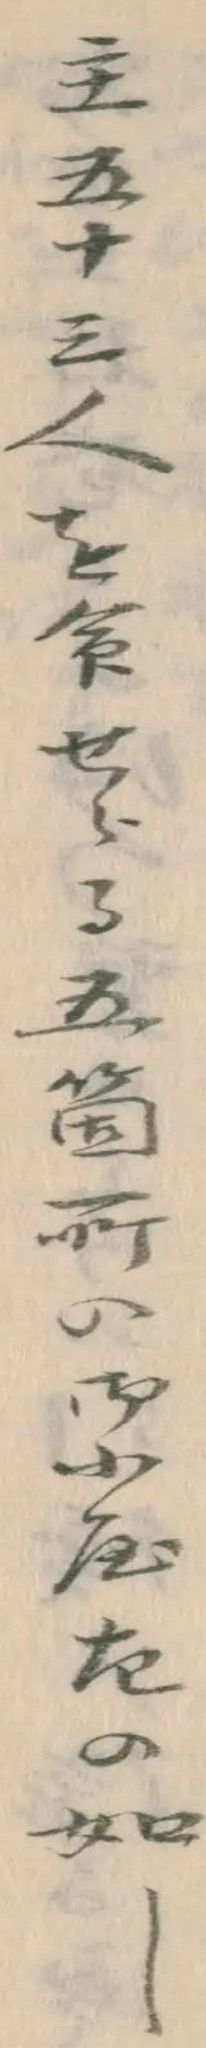主五十三人を命せらる五箇所の御小屋左の如し
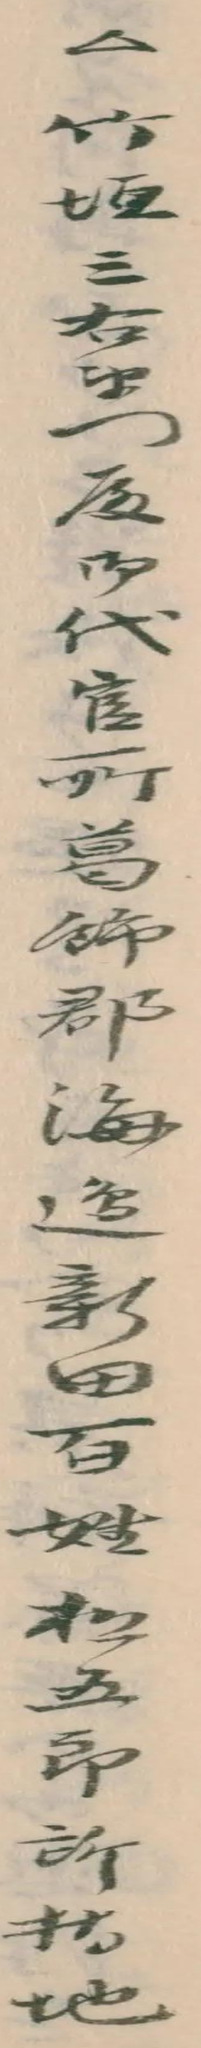△竹垣三右衛門殿御代官所葛飾郡海辺新田百姓松五郎所持地
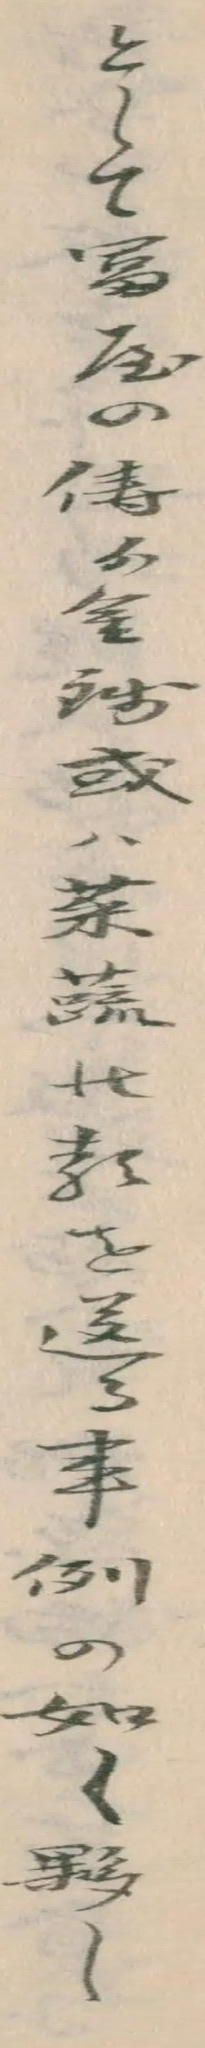として冨屋の俦ゟ金銭或は菜蔬の類を送る事例の如く夥し
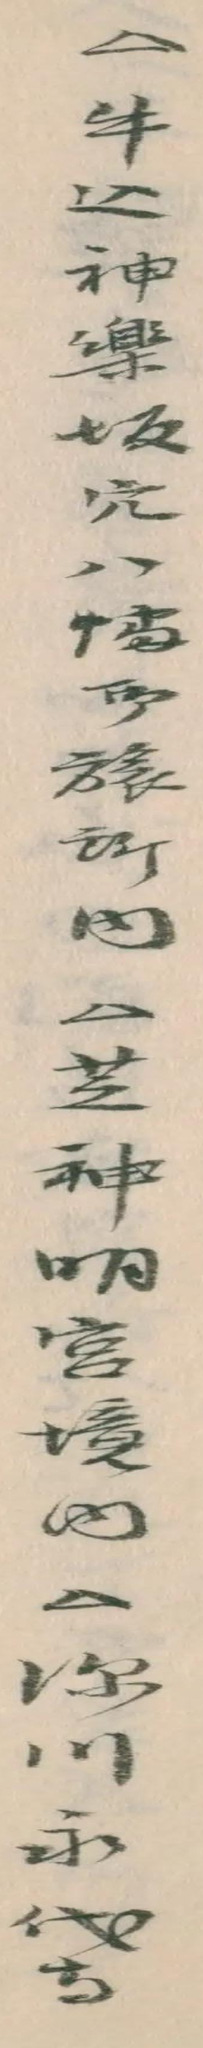△牛込神楽坂穴八幡御旅所内△柴神明宮境内△深川永代寺
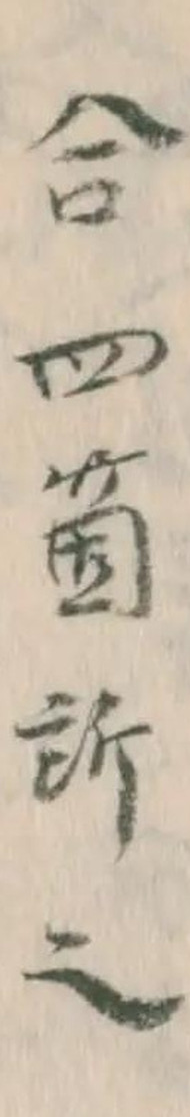合四箇所也
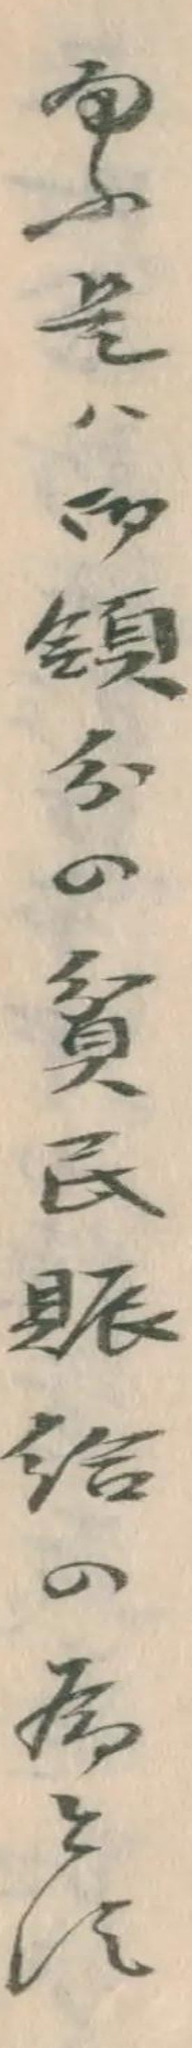給ふ是は御領分の貧民賑給の為とす

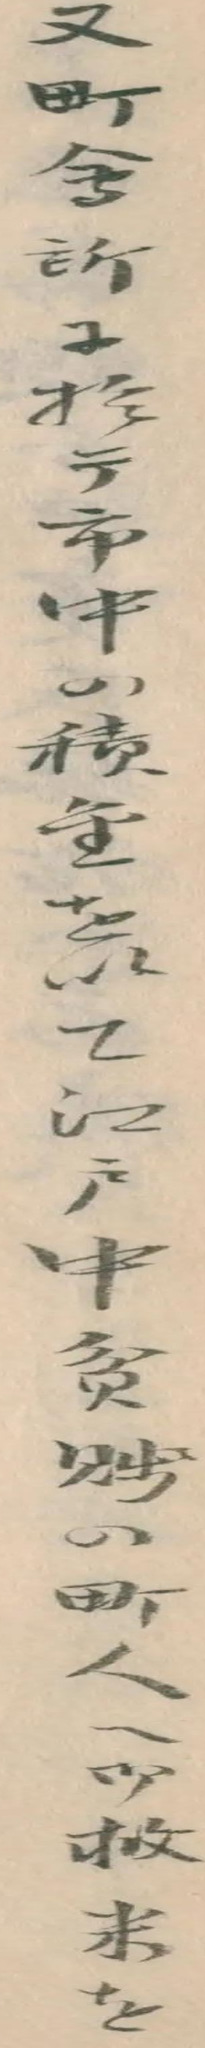又町会所に於テ市中の積金を以て江戸中貧賎の町人へ御救米を
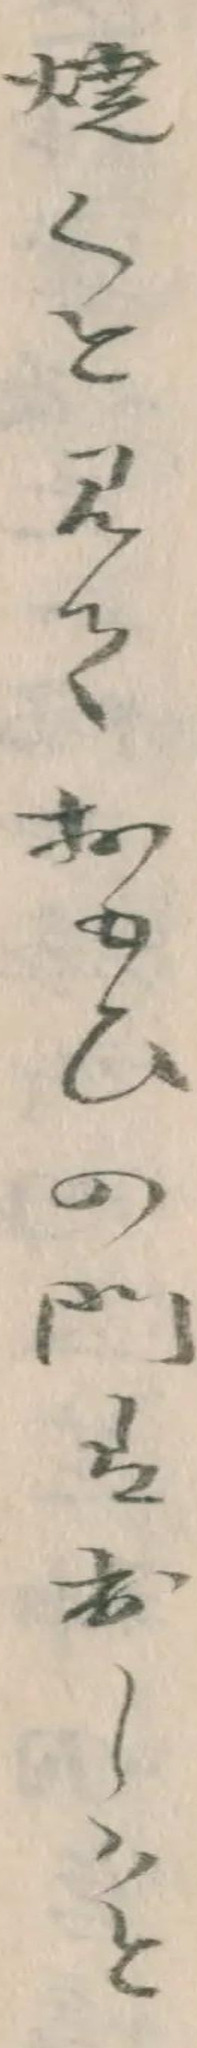焼くと見ておもひの門は出しかと
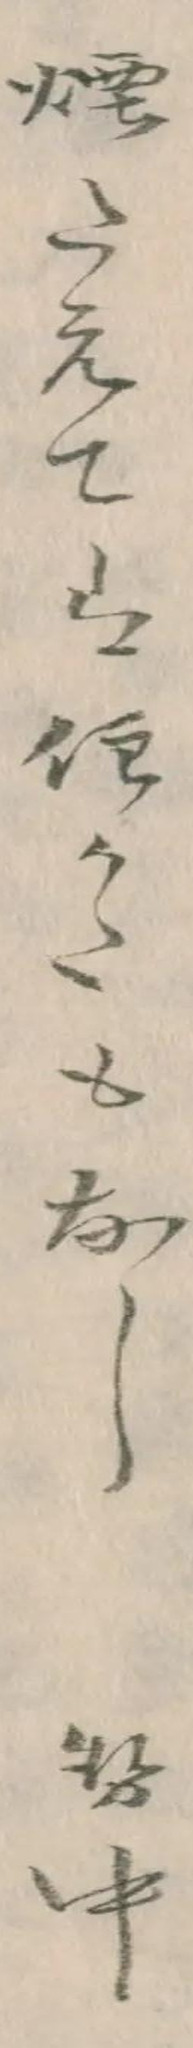煙たえては住かたもなし勢中
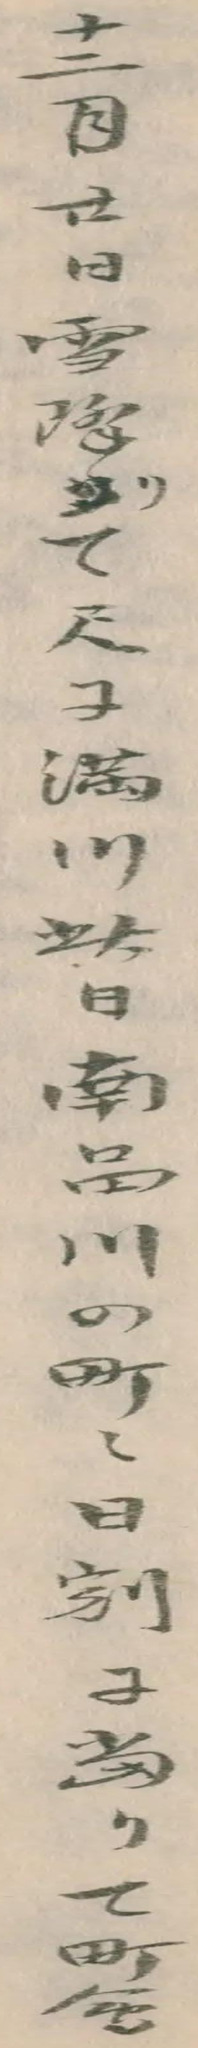十二月廿日雪降りて尺に滿つ此日南品川の町々日割に当りて町会
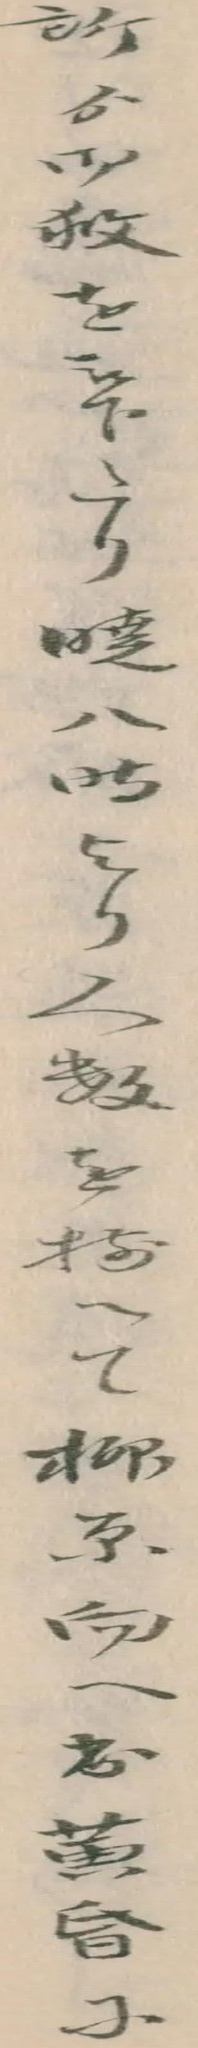所ゟ御救を取下たり暁八時より人数を揃へて柳原向へ出黄昏に
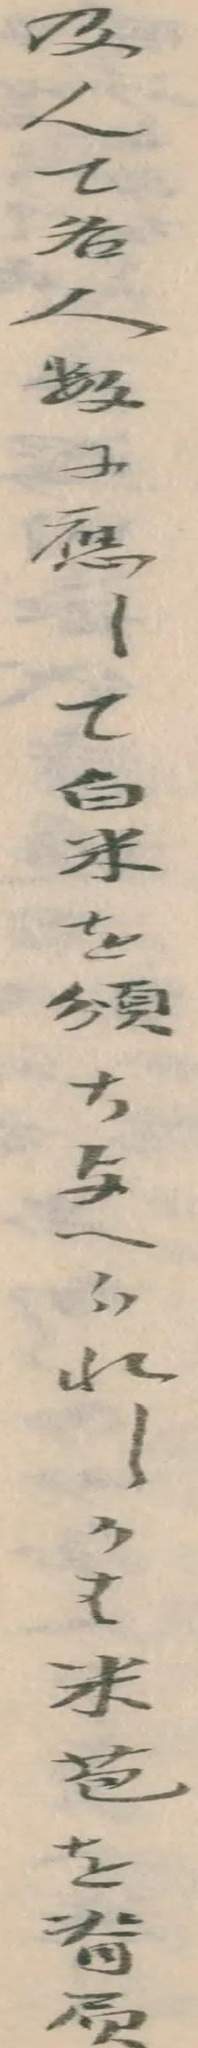及んて各人数に応して白米を頒ち与へられしかは米苞を脊負
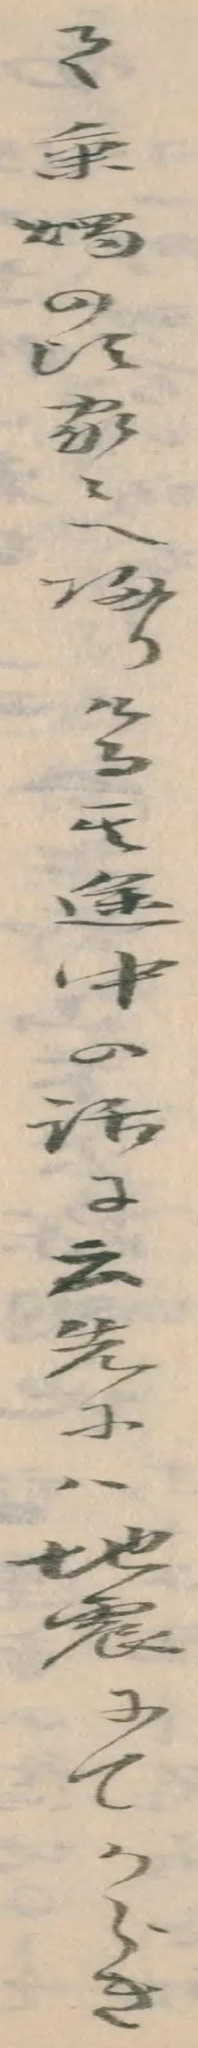て秉燭の頃家々へ帰りける其途中の話に云先には地震にてからき
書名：地災撮要. 巻7-9(地震之部)
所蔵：国立国会図書館 National Diet Library, JAPAN
